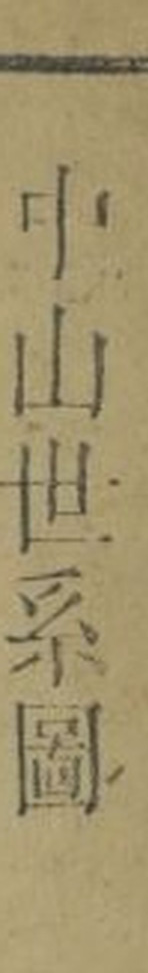中山世系図

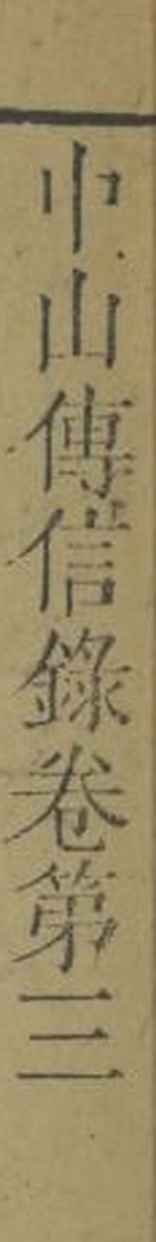中山伝信録巻第三
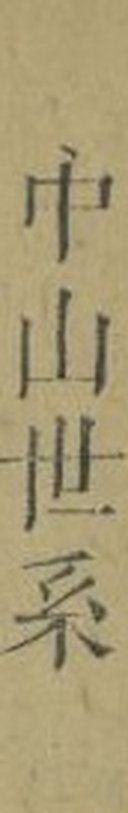中山世系
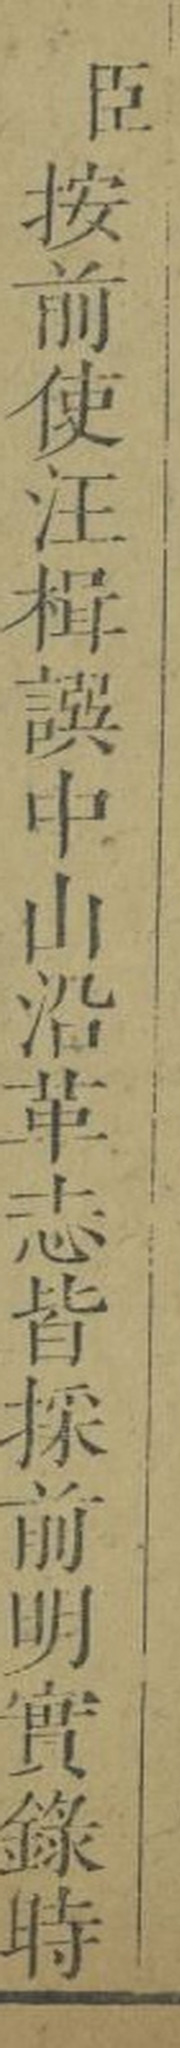臣按前使汪楫誤中山沿革志皆採前明実録時
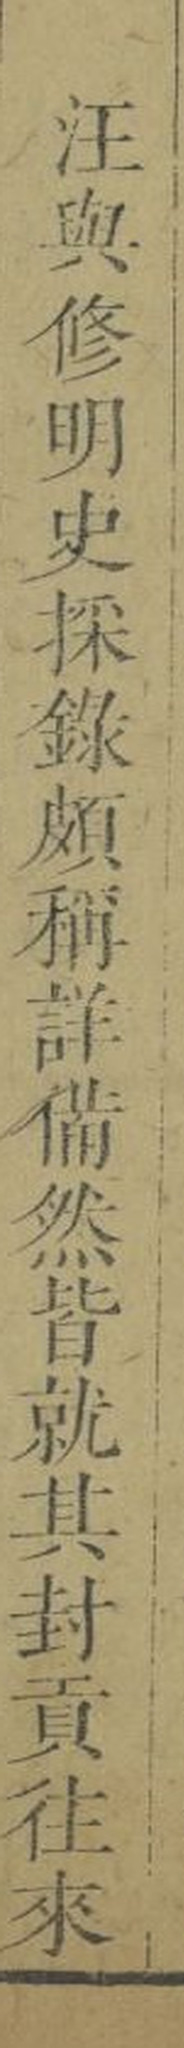汪与修明史採録頗称詳備然皆就其封貢往来
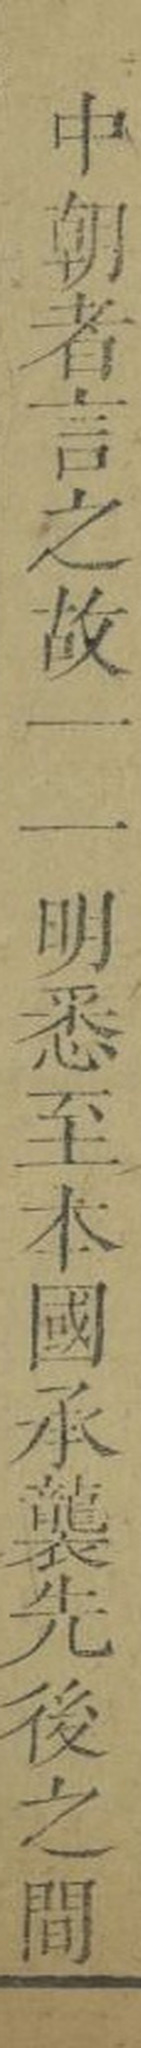中朝者言之故一一明悉至本国承襲先後之間
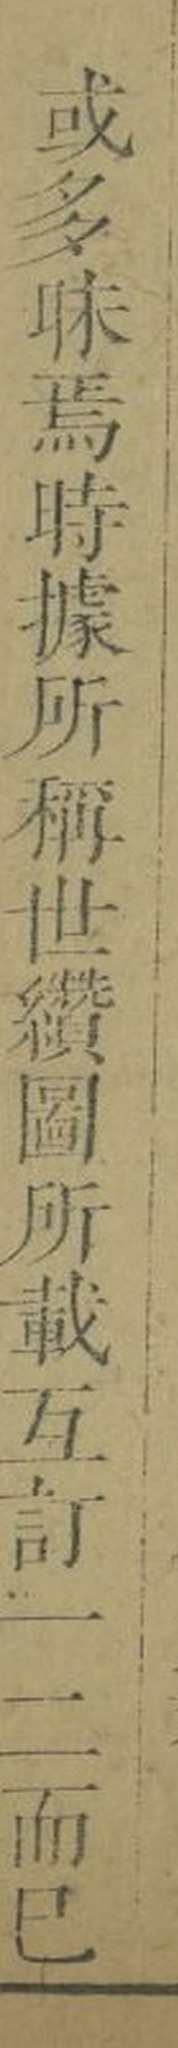或多昧焉時拠所称世纘図所載互訂一二而已
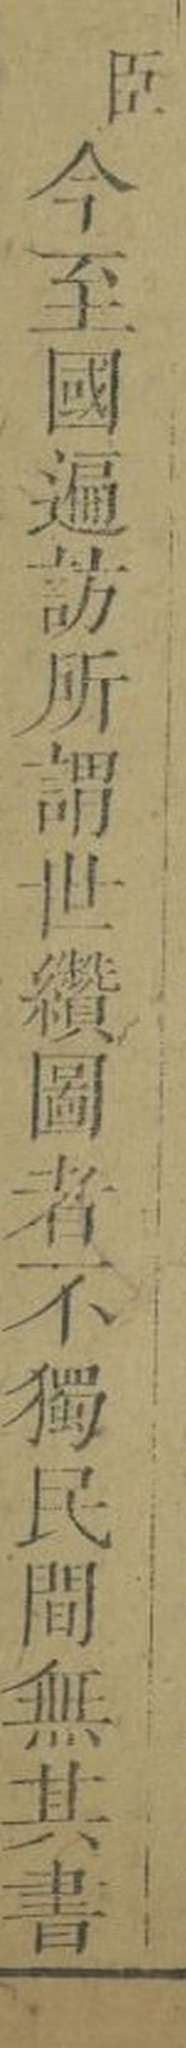臣今至国遍訪所謂世纘図者不独民間無其書
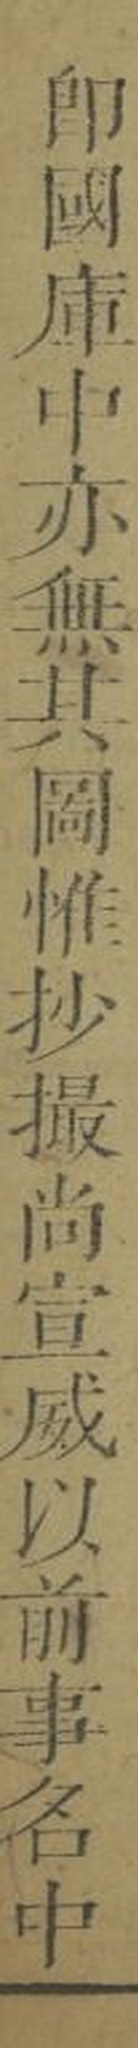即国庫中亦無其図惟抄撮尚宣威以前事名中

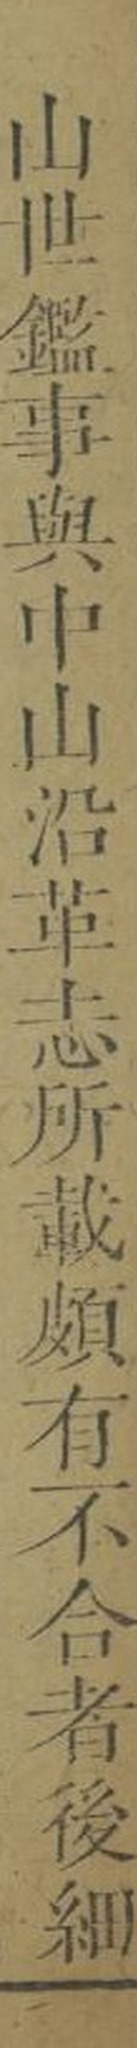山世鑑事与中山沿革志所載頗有不合者後細
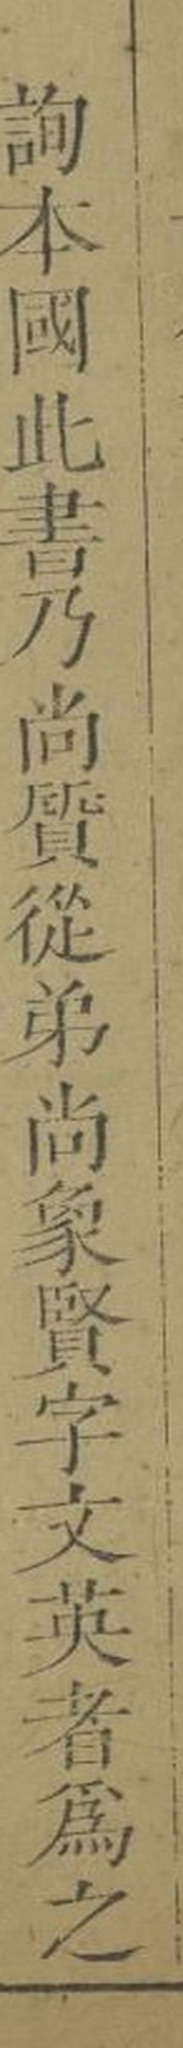詢本国此書乃尚質従弟尚象賢字文英者為之
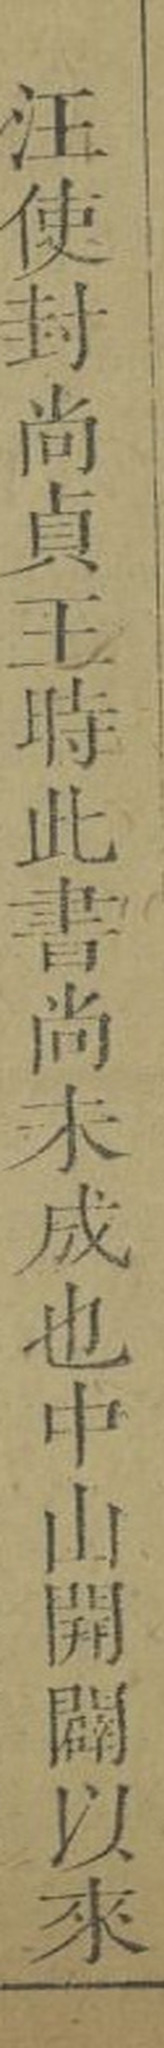汪使封尚貞王時此書尚未成也中山開闢以来
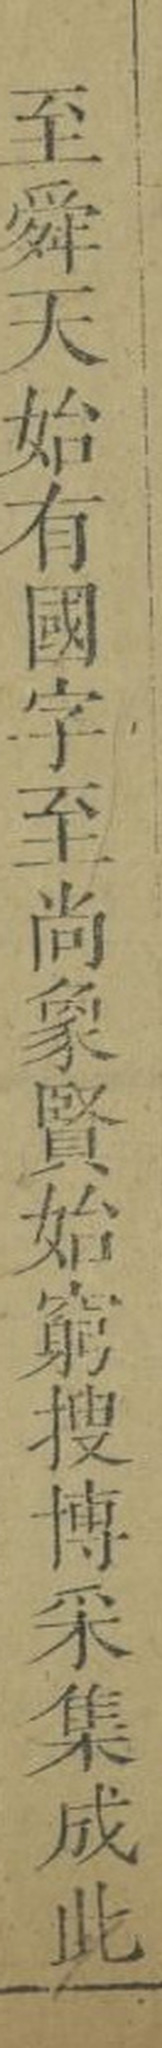至舜天始有国字至尚象賢始窮捜博采集成此
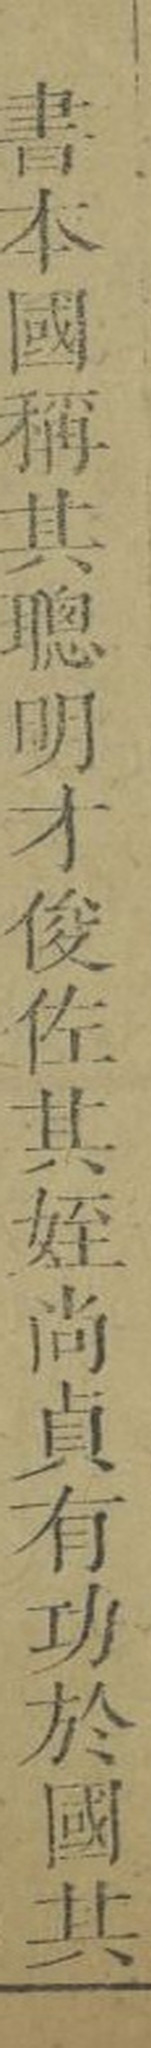書本国称其聡明才俊佐其姪尚貞有功於国其
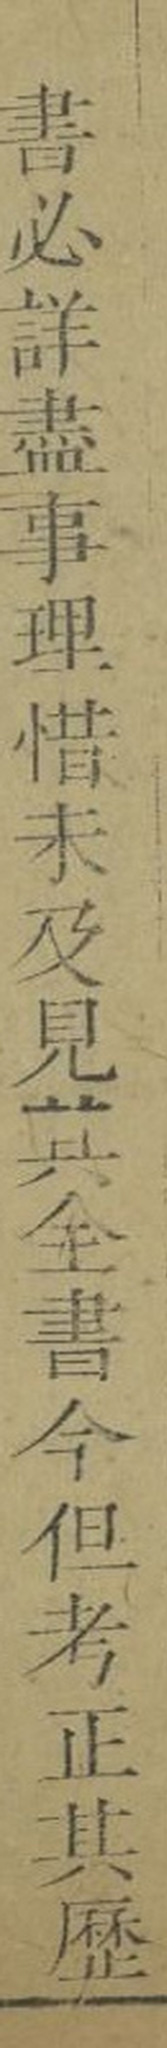書必詳尽事理惜未及見其全書今但考正其歴
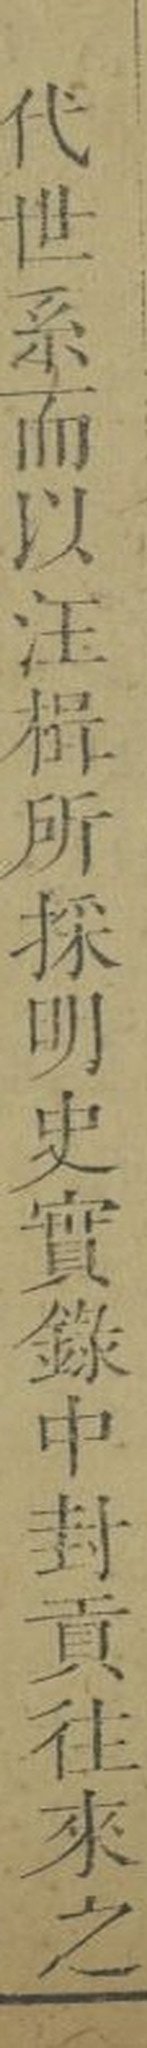代世系而以汪楫所採明史実録中封貢往来之
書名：中山伝信録 巻三
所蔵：University of the Ryukyus Library
